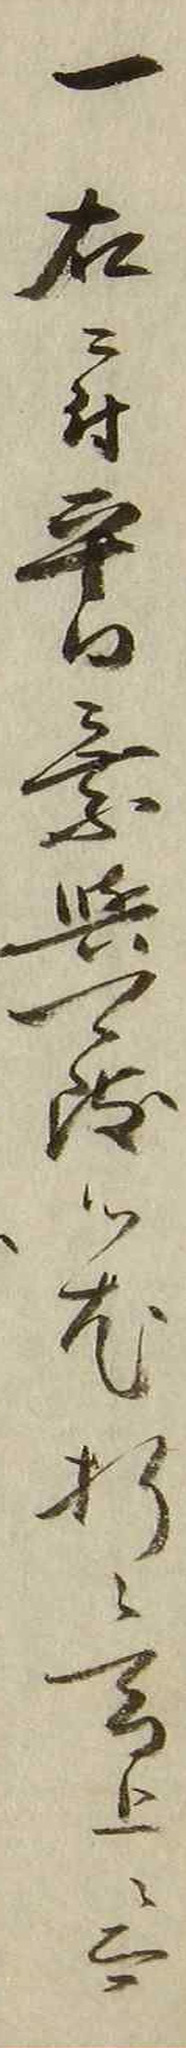一右に付平日乗輿可致候尤折々馬上に而
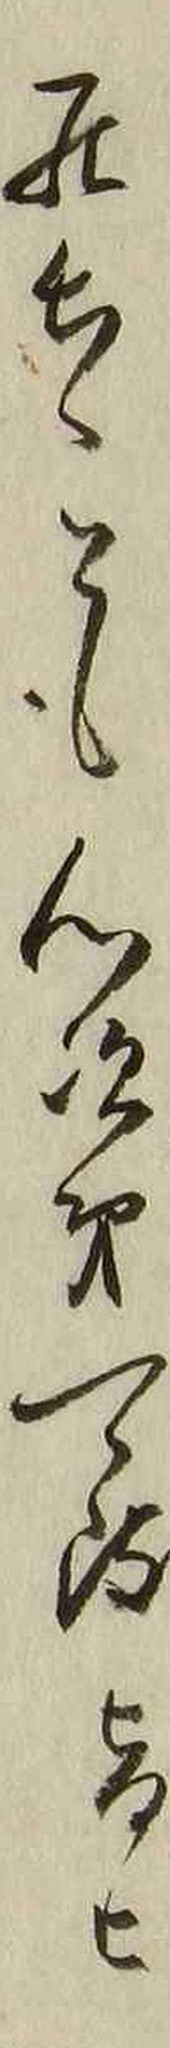罷出候とも心次第可致旨被
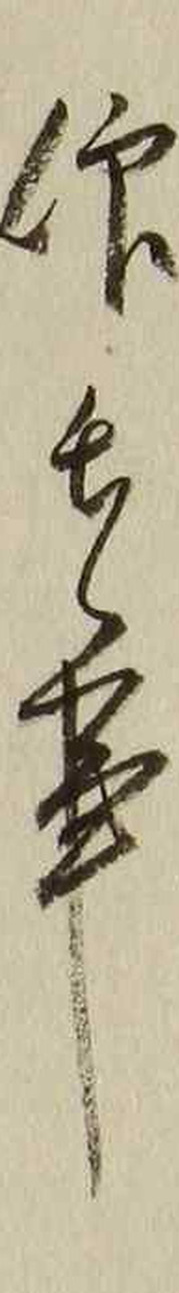仰出候事
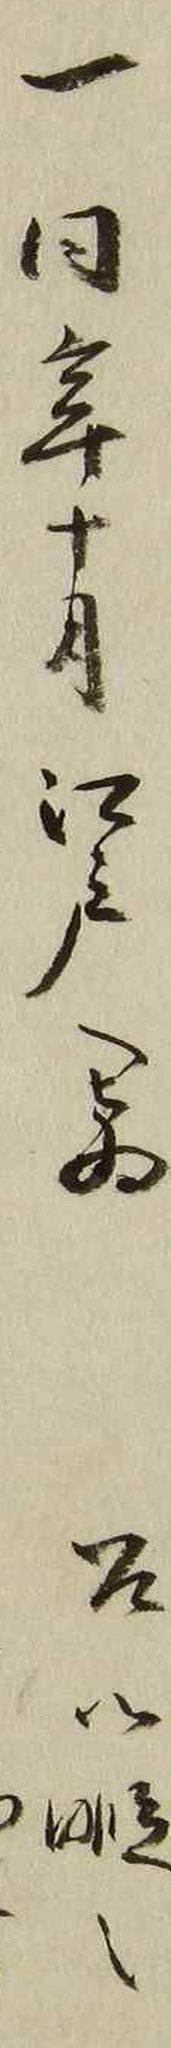一同年十月江戸へ被為召御暇之
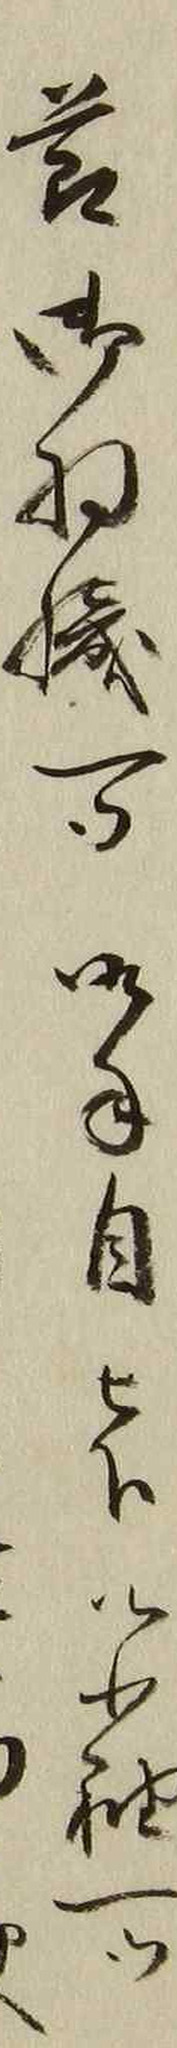節御羽織一つ御手自被下御小袖一つ
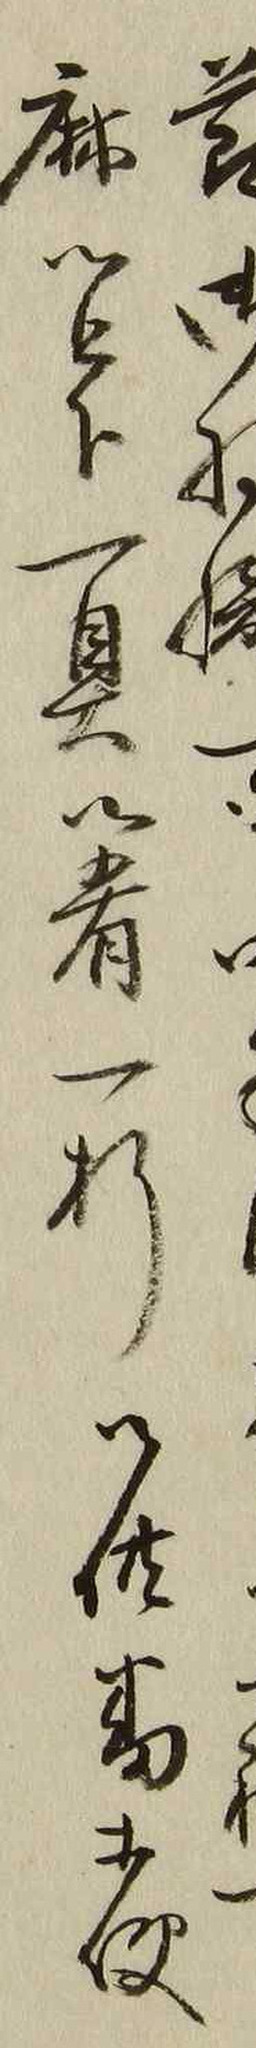麻御上下一具御肴一折御供番御使
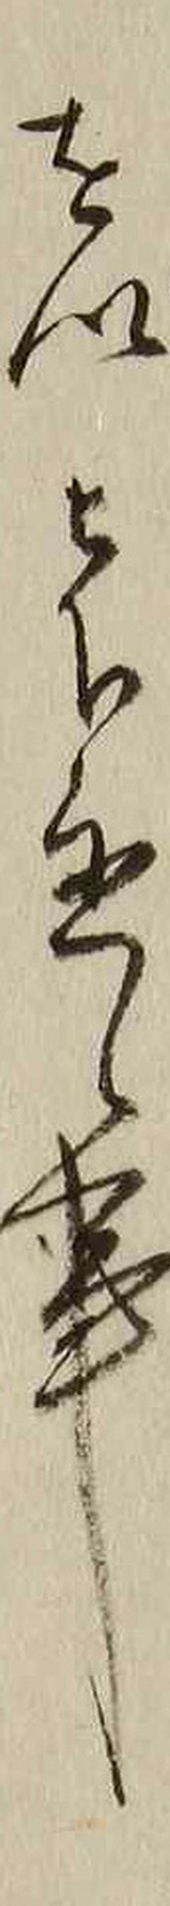を以被下置候事
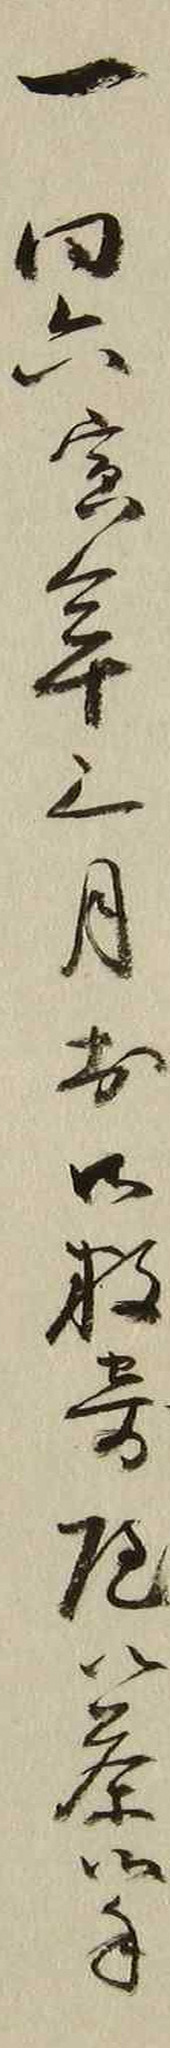一同六寅年三月於御数寄屋御茶御手
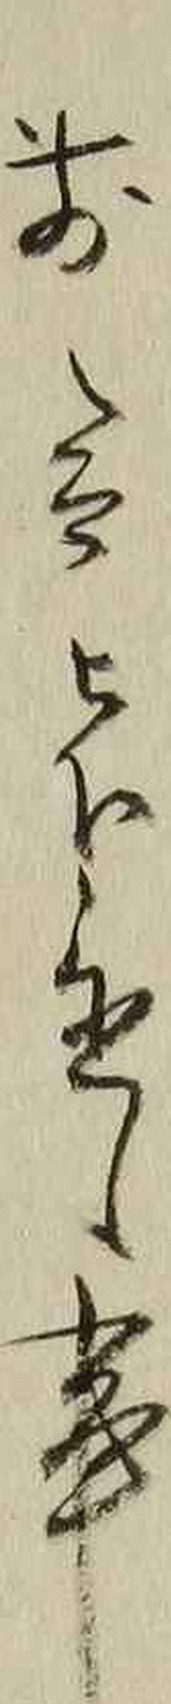前に而被下置候事
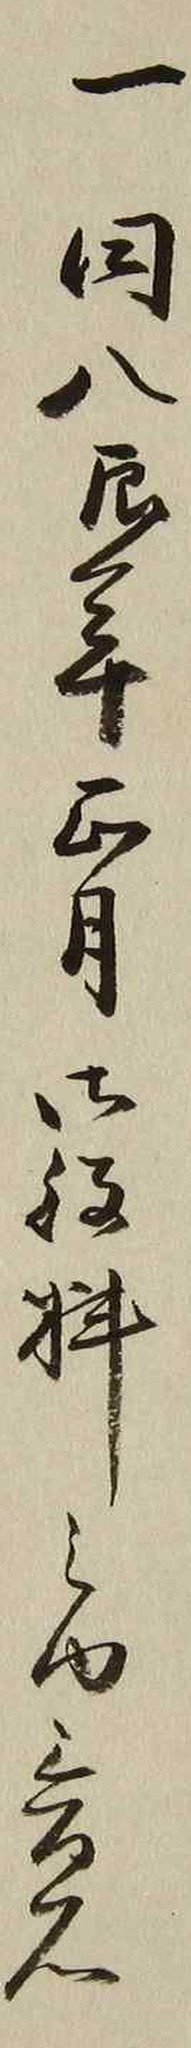一同八寅年正月御役料之内三百石
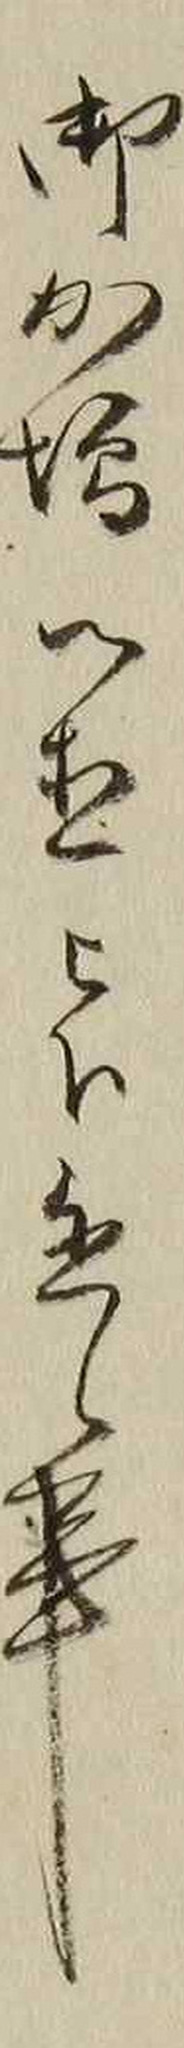御加増御直被下置候事
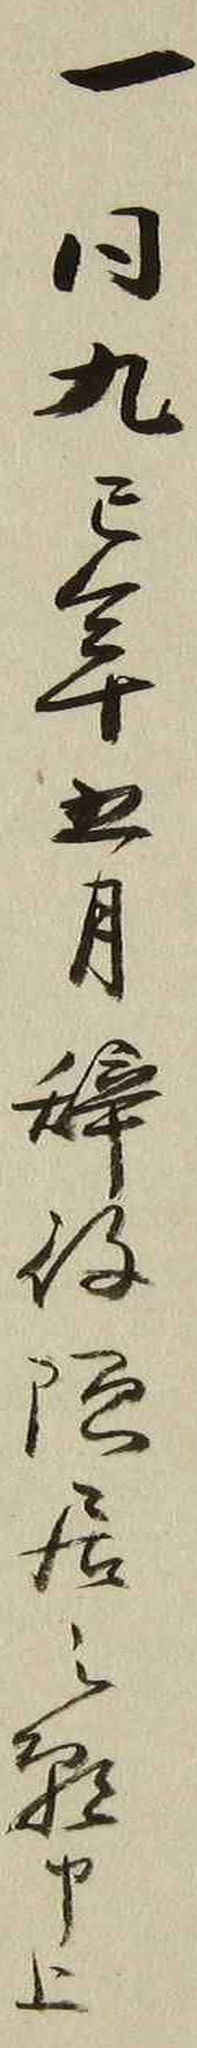一同九巳年五月辞役隠居之願申上
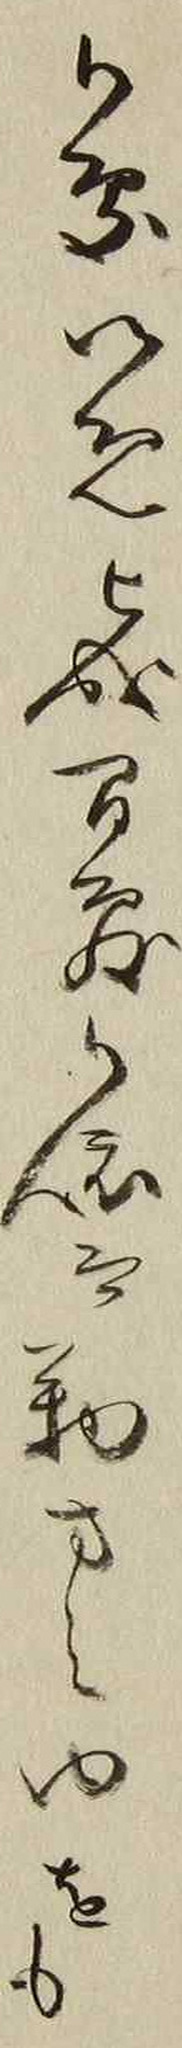候処御免被成間敷候依而勤方之内をも
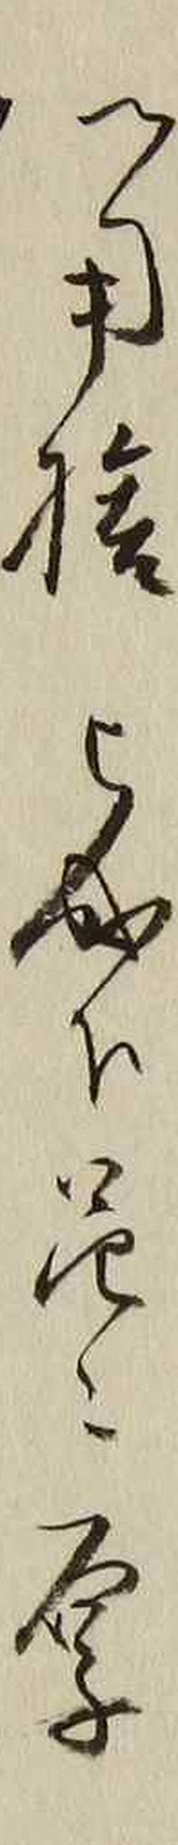御用捨被成下候由に厚
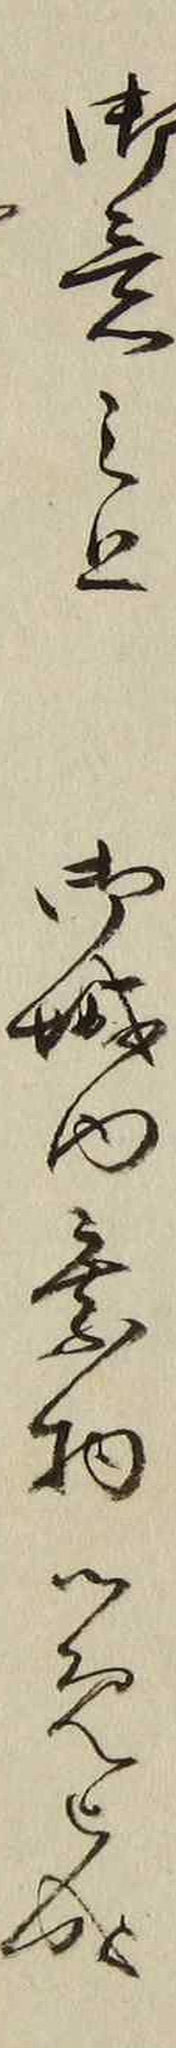御意之上御城内乗物御免被成
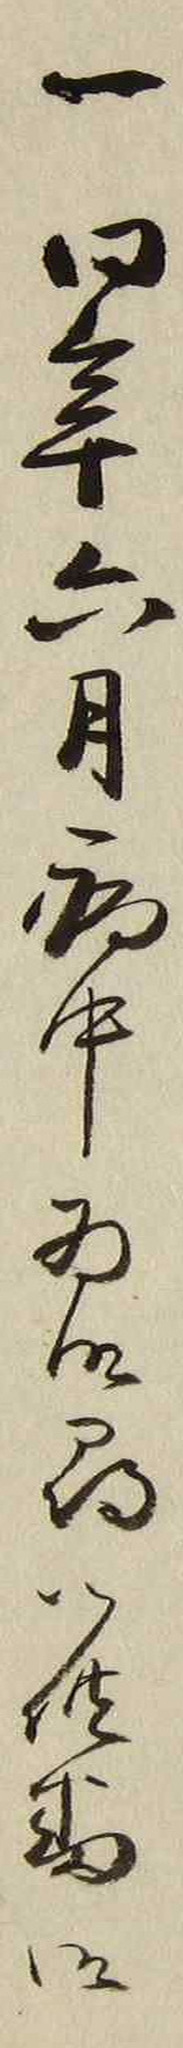一同年六月病中為御尋御供番御
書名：諸士系譜　巻之292　き之部1
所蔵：会津若松市立会津図書館
